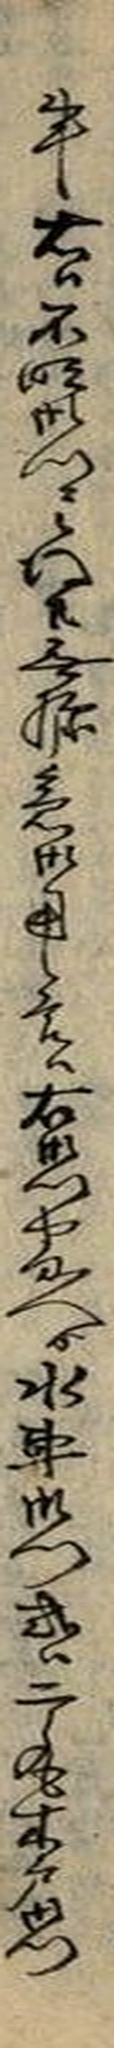事右は不明御門に候得共無拠急御用之節は右御門番人ゟ水車御門或は二之丸木戸御門
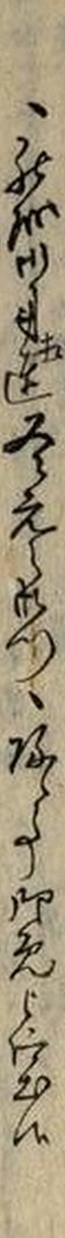へ罷越御用相達又々元之御門へ帰候事御免被仰出候
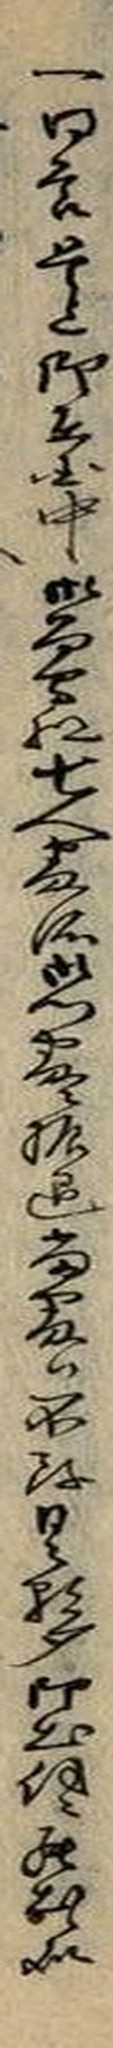一同節是迄御在国中御留守組七人番所御門番に振退当番は不致日々朝夕御出伺に罷出候処
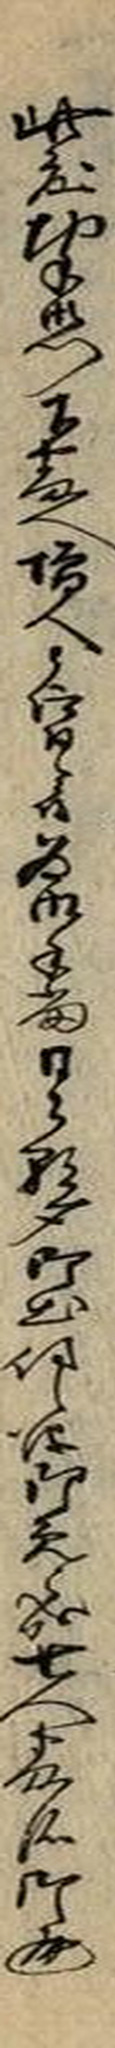此度切手御門下番人増人被仰付候に付為御手当日々朝夕御出伺之儀御免被成七人番所御通
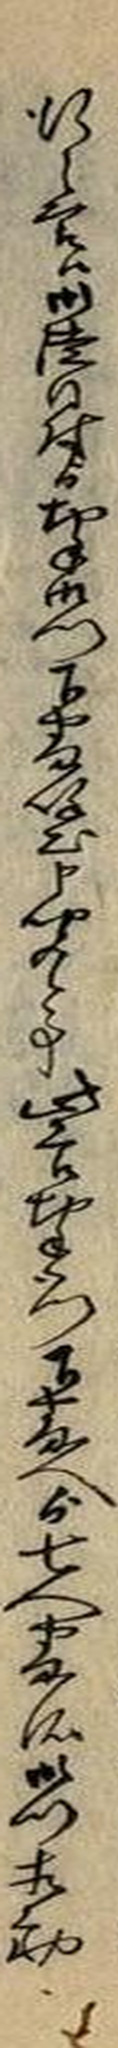行之節は御徒目付ゟ切手御門下番呼出申聞候事此節切手御門下番人ゟ七人番所御門相勤
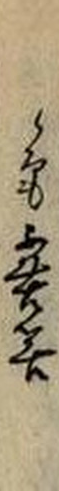候而も不苦筈
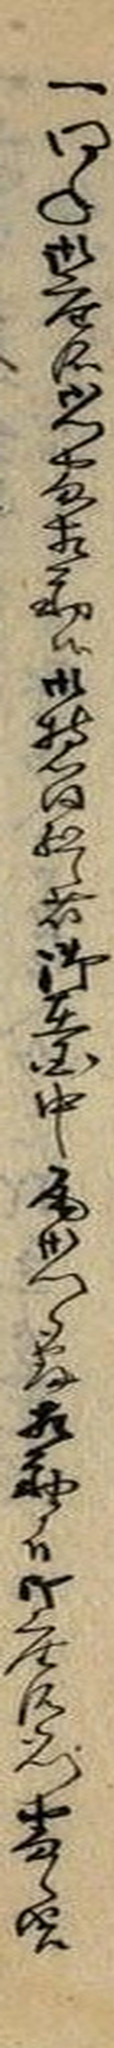一同年御座所御門番相勤候御持筒組之者御在国中瓦御門御番相勤候に付御座所御門番之儀は
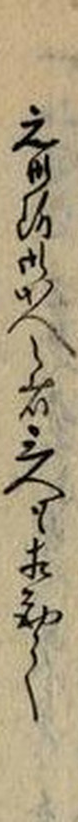元御附御小人之者三人ツヽ相勤之
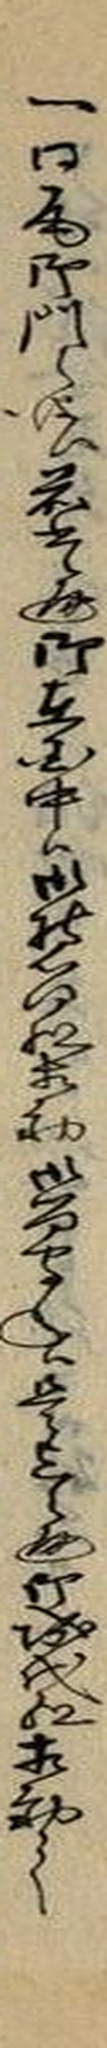一同瓦御門之儀は前書之通御在国中は御持筒組相勤御留守年は是迄之通御城代組相勤之
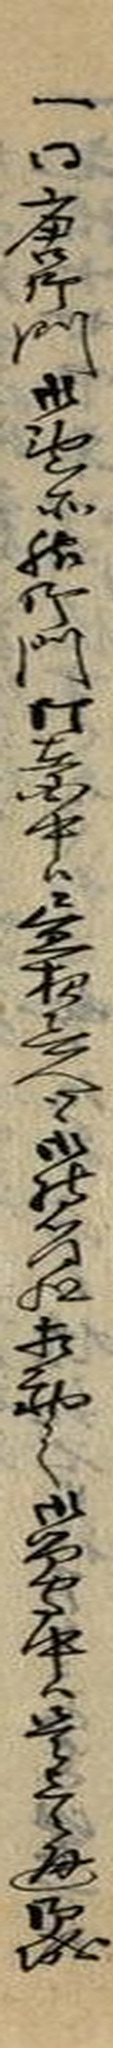一同唐御門御台所脇御門御在国中ハ昼夜壱人ツヽ御持筒組相勤之御留守中ハ是迄之通御城
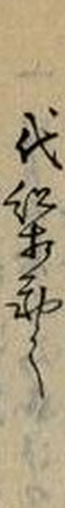代組相勤之
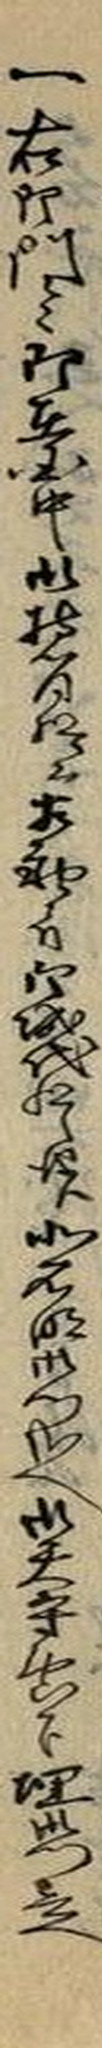一右御門々々御在国中御持筒組に而相勤候に付御城代組之儀は北不明御門弐人御天守台下埋御門壱人
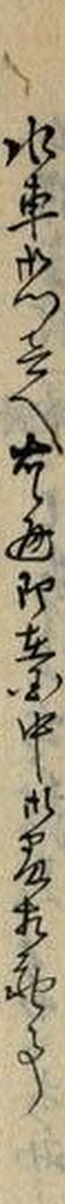水車御門壱人右之通御在国中御番相勤候事
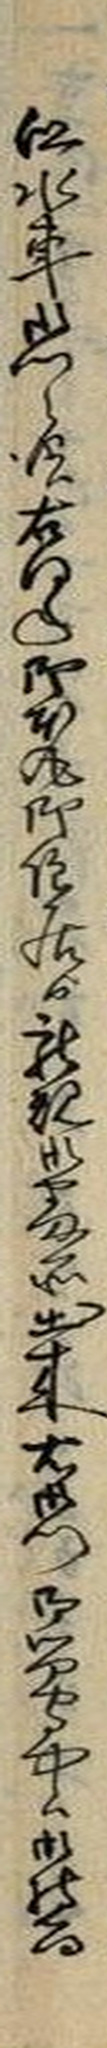但水車御門之儀は右同年御本丸御住居ゟ新規御番所出来右御門御留守中は御持筒
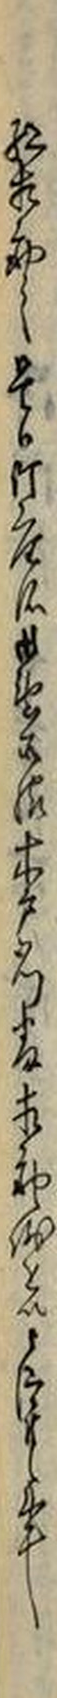組相勤之是は御座所御台所脇木戸御門番相勤例を以被仰付候事
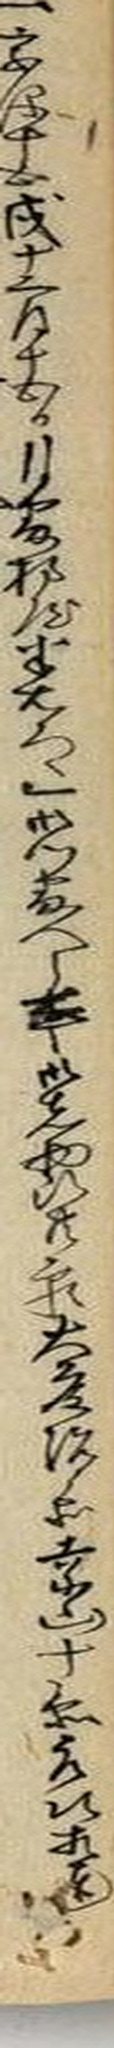一享保十五戌十二月十五日月番栃屋半左衛門へ」御門番人の事御先物頭共願大藤治兵衛桑山十兵衛取次相達
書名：御門御櫓之部
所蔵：福井県文書館 Fukui Prefectural Archives
